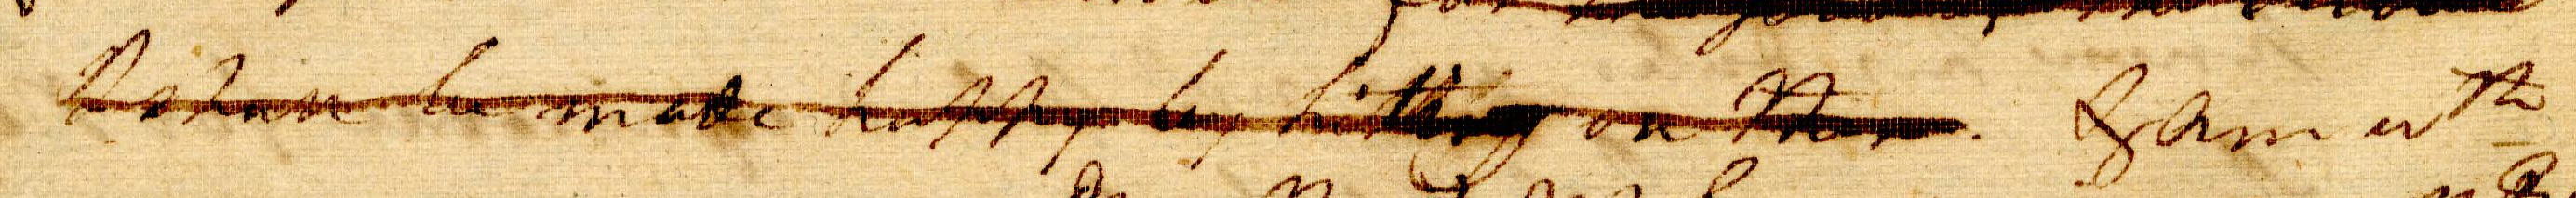[do have be made happy by hitting on them] & am w^th
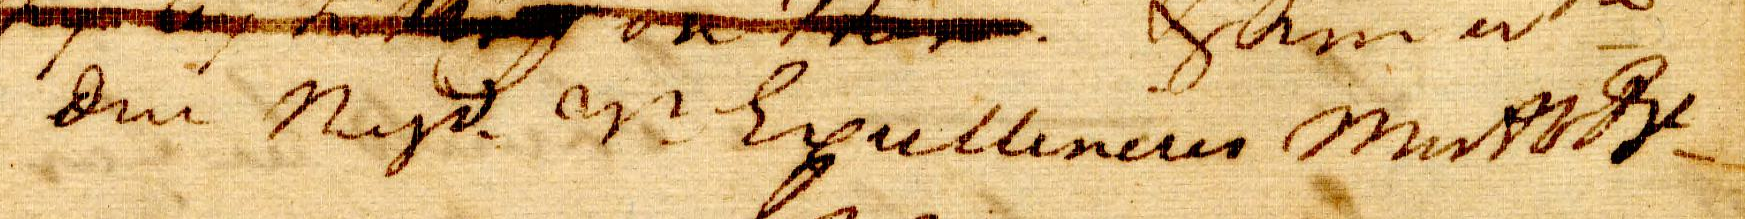due Reg^d. y^r. excellencies Most Ob S-
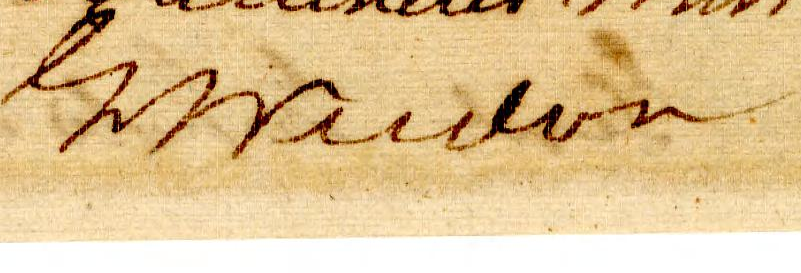G Weedon
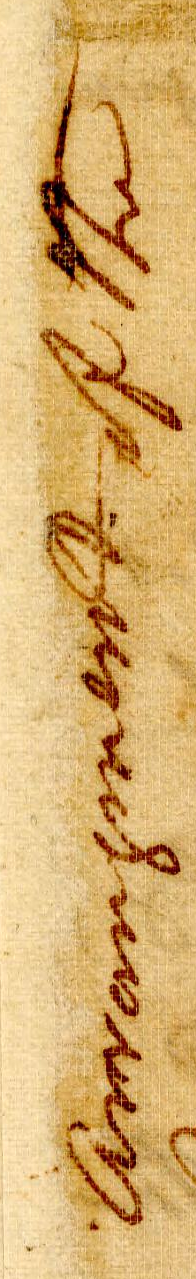Arrangment of the
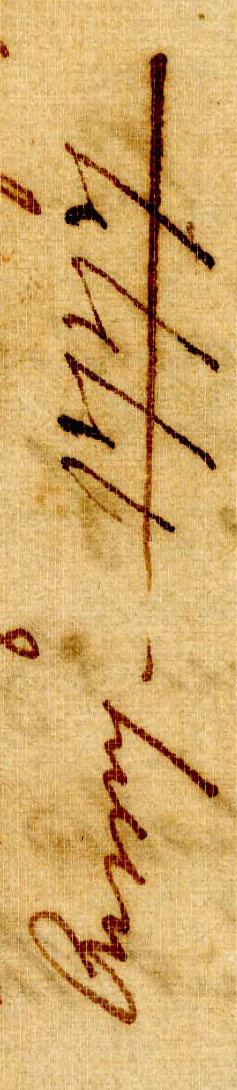Army. 1777
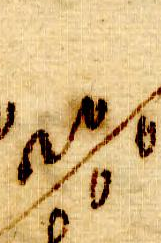20
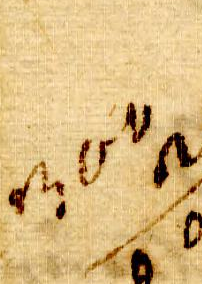300
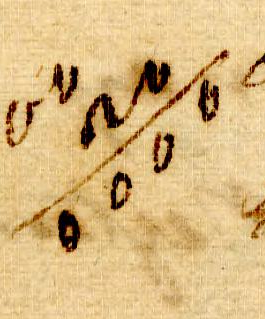0000
